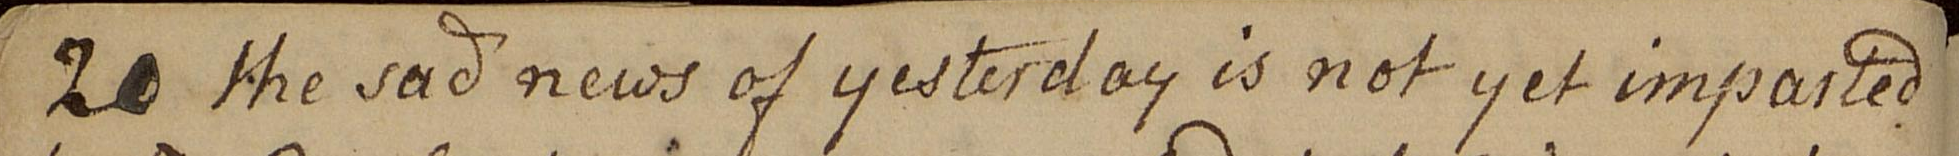20 the sad news of yesterday is not yet imparted
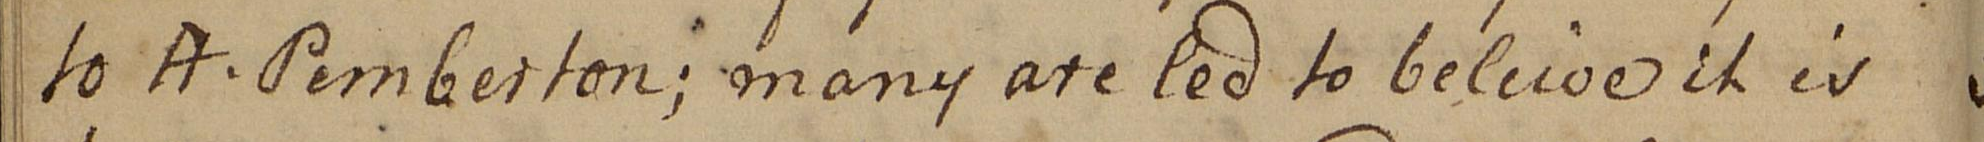to H. Pemberton; many are led to beleive it is
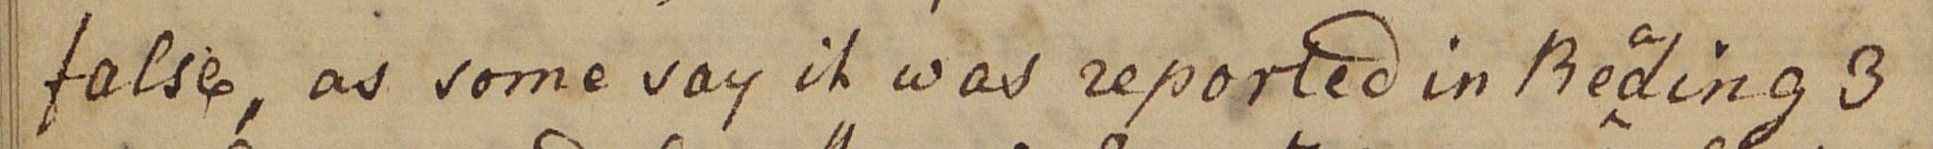false, as some say it was reported in Re^ading 3
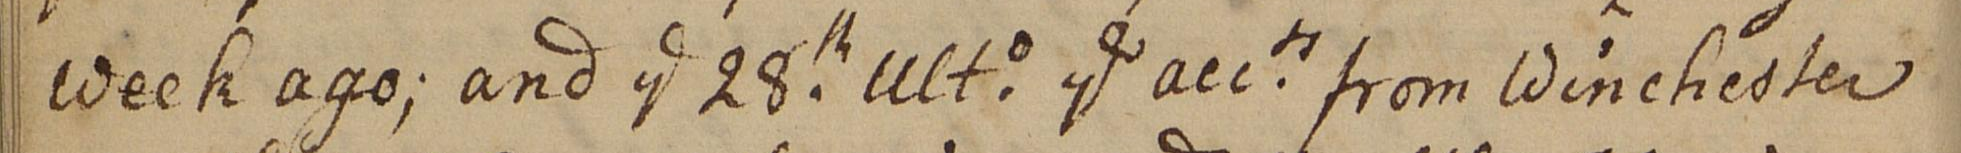Week ago; and y^e 28^th. Ult^o. y^e acc^ts. from Winchester
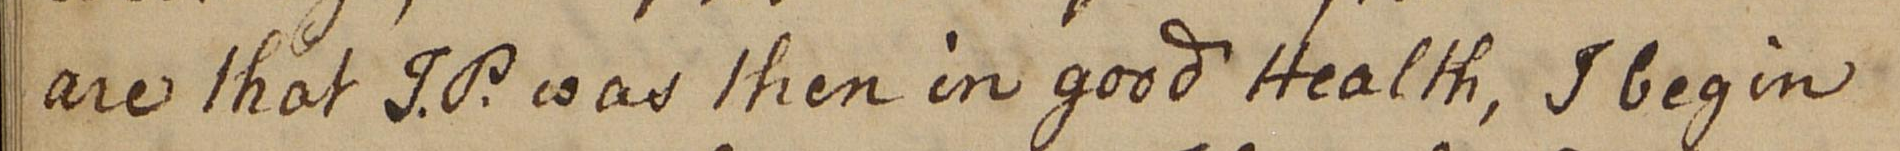are that J.P. was then in good Health, I begin
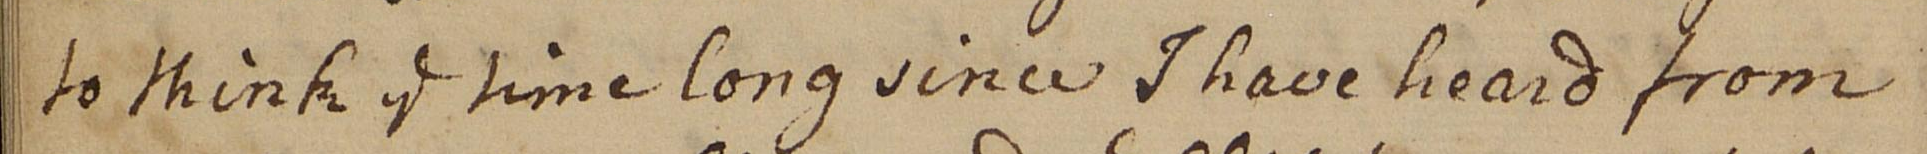to think y^e time long since I have heard from
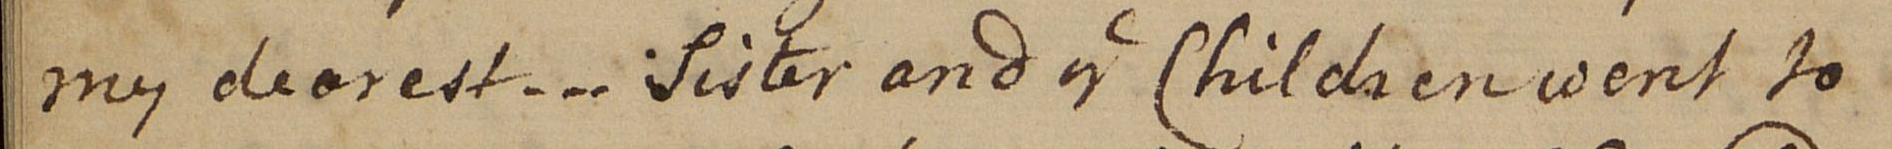my dearest-- Sister and y^e Children went to
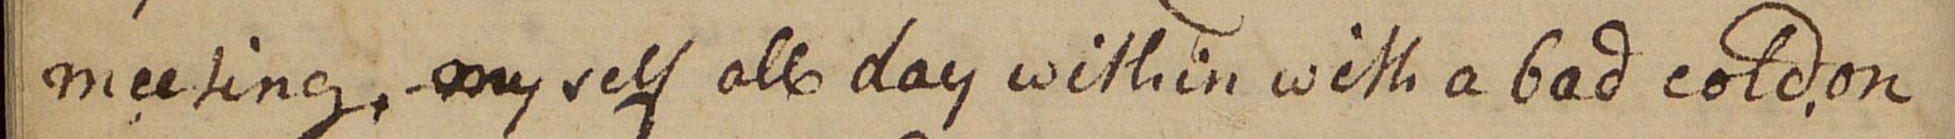meeting, myself all day with in with a bad cold, on
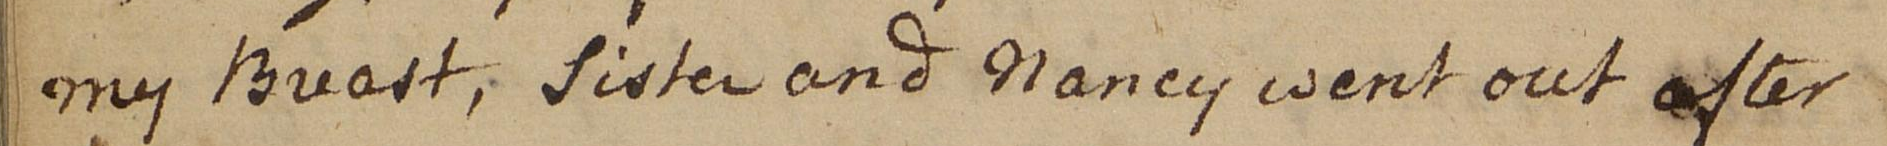my Breast, Sister and Nancy went out after
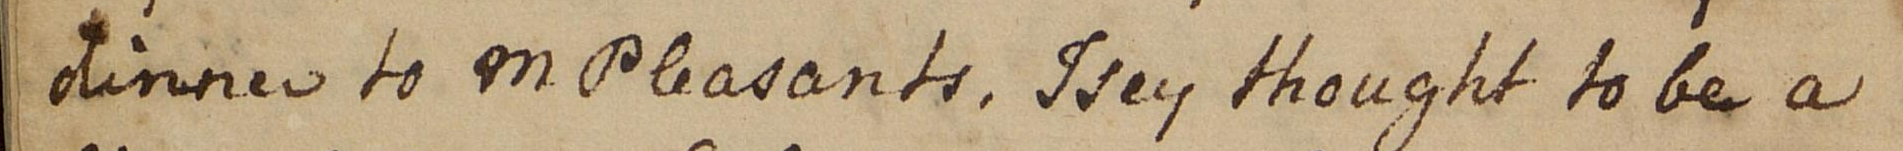dinner to M Pleasants, Jsey thought to be a
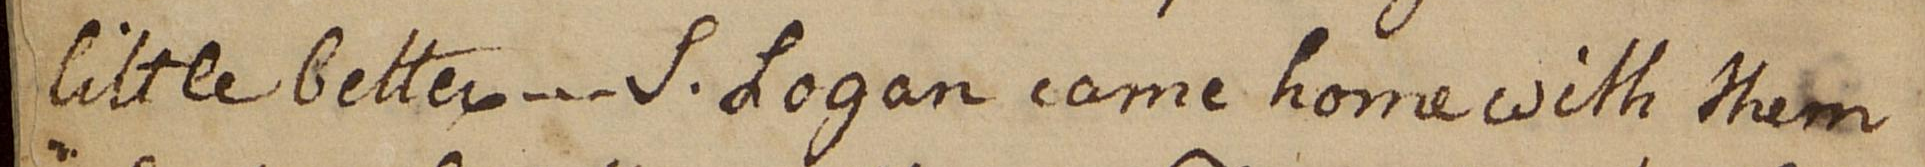little better--- S. Logan came home with them
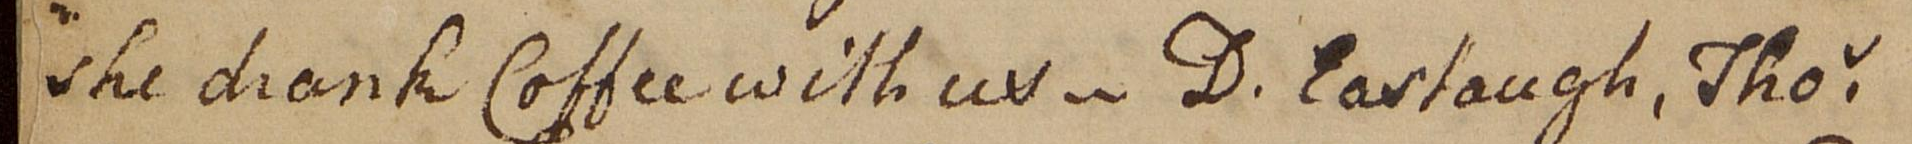she drank Coffee with us- D. Eastaugh, Tho^s.
